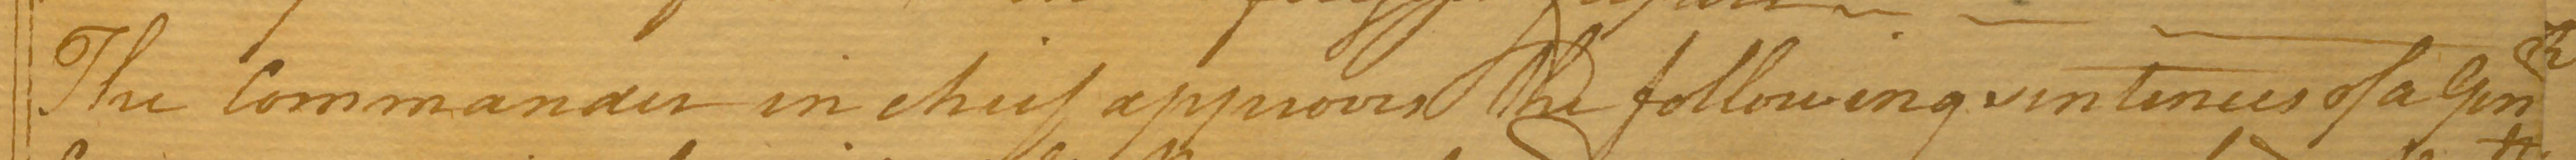The Commander in chief approves the following sentences of a Gen^l
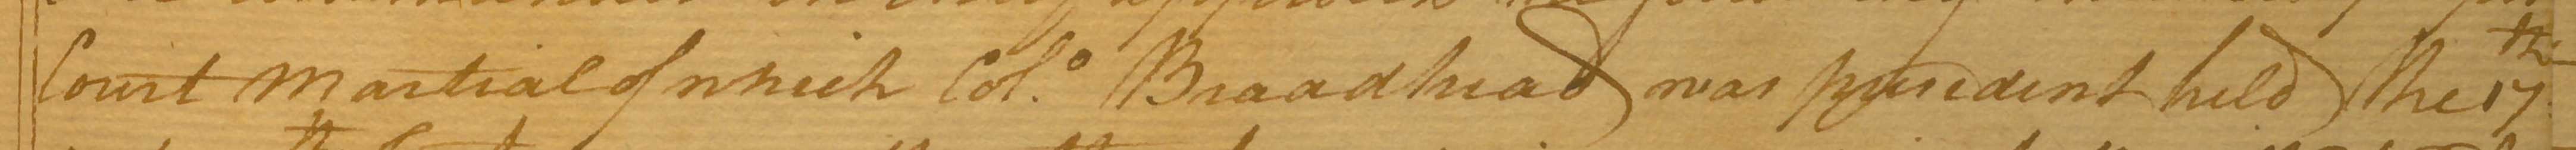Court martial of which Col^o. Broadhead was president held the 17^th
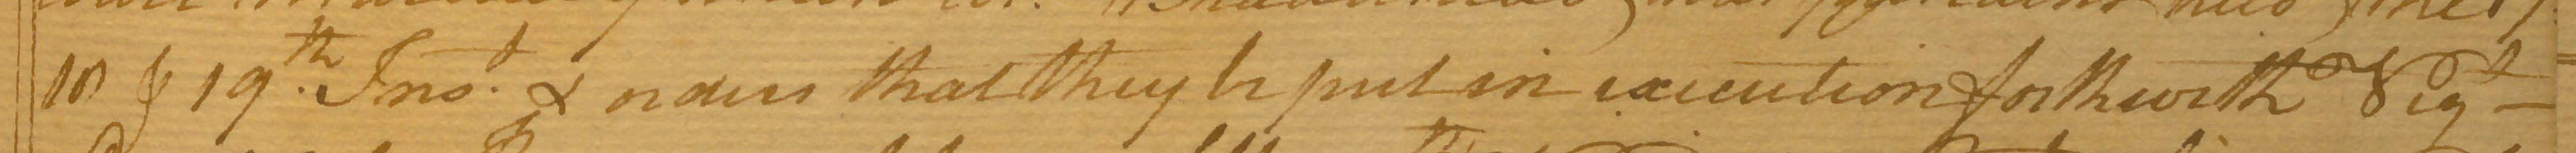18 & 19^th. Ins^t. & orders that they be put in execution forthwith Viz^t-
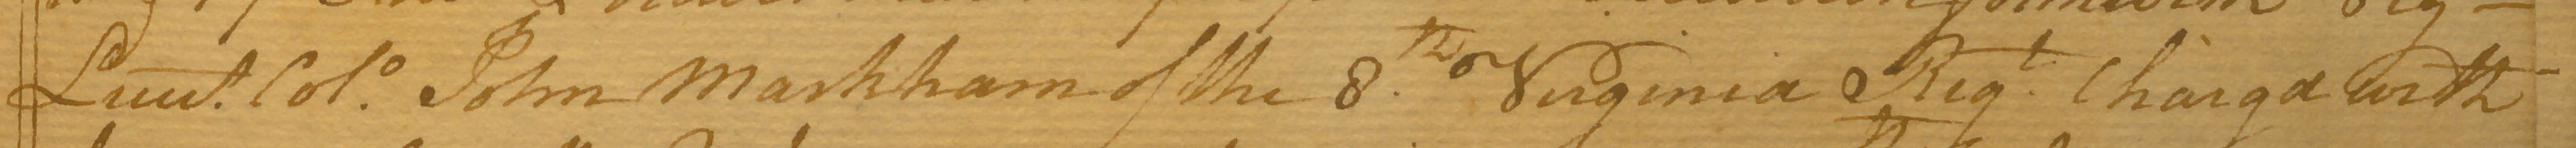Lieu^t. Col^o. John Markham of the 8^th. Virginia Reg^t. chargd with
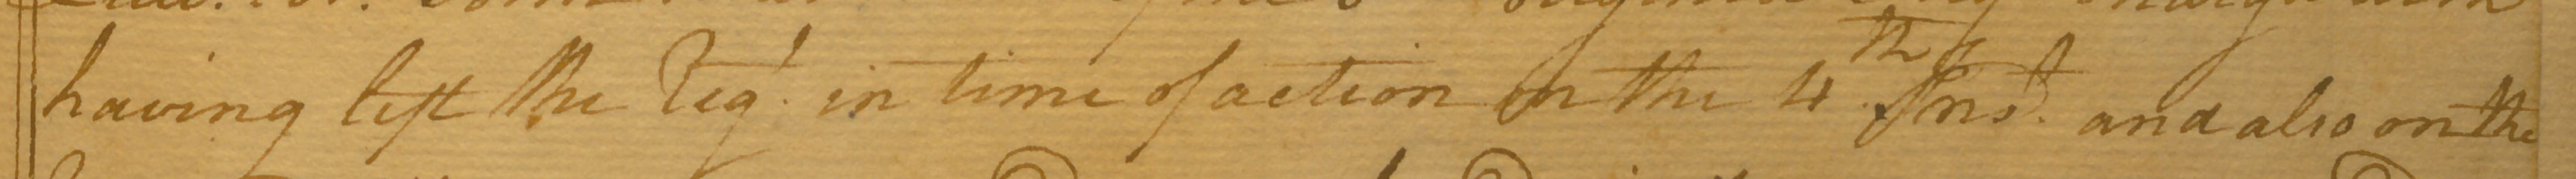having left the Reg^t. in time of action on the 4^th. Ins^t. and also on the
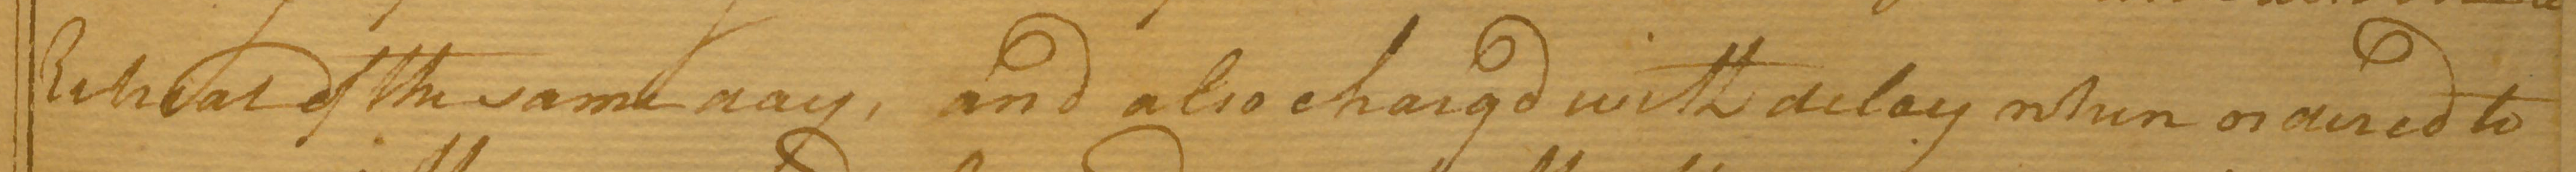retreat of the same day, and also chargd with delay when ordered to
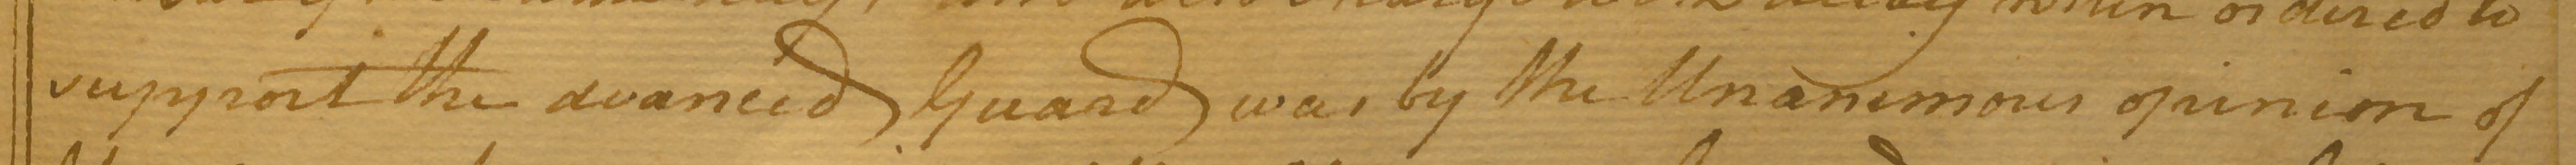support the advanced Guard was by the Unanimous opinion of
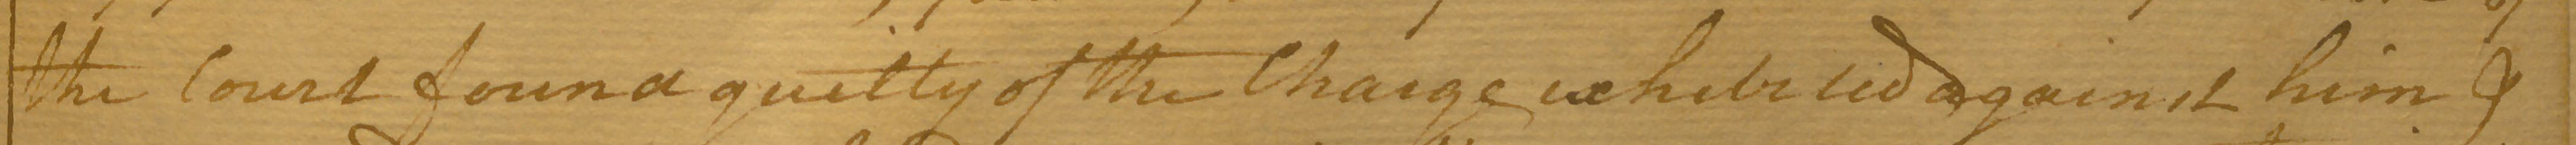the Court found guilty of the Charge exhibited against him &
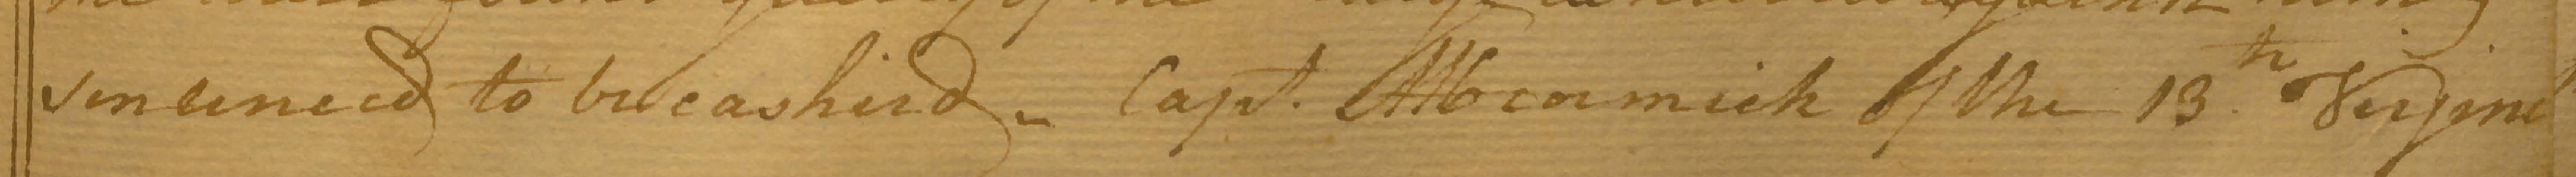sentenced to be cashird- Cap^t. Albcormick of the 13^th Virginia
